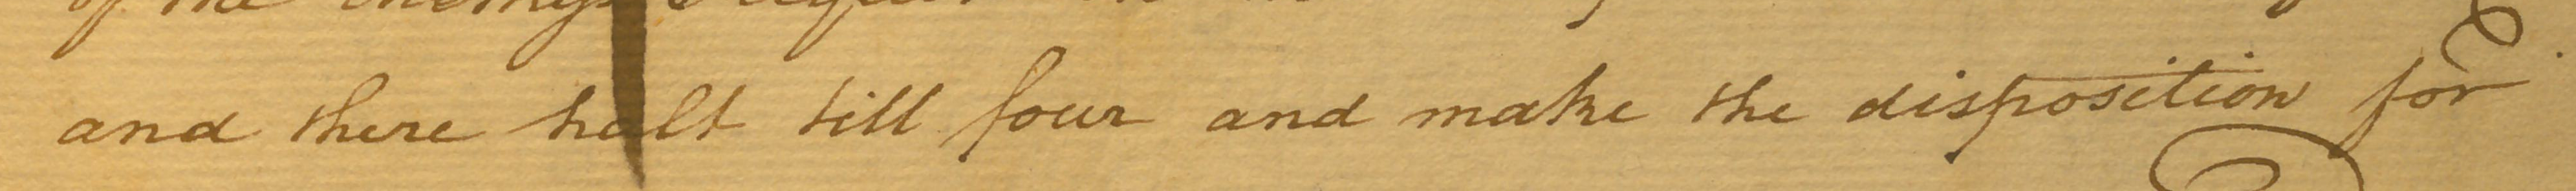and there halt till four and make the disposition for
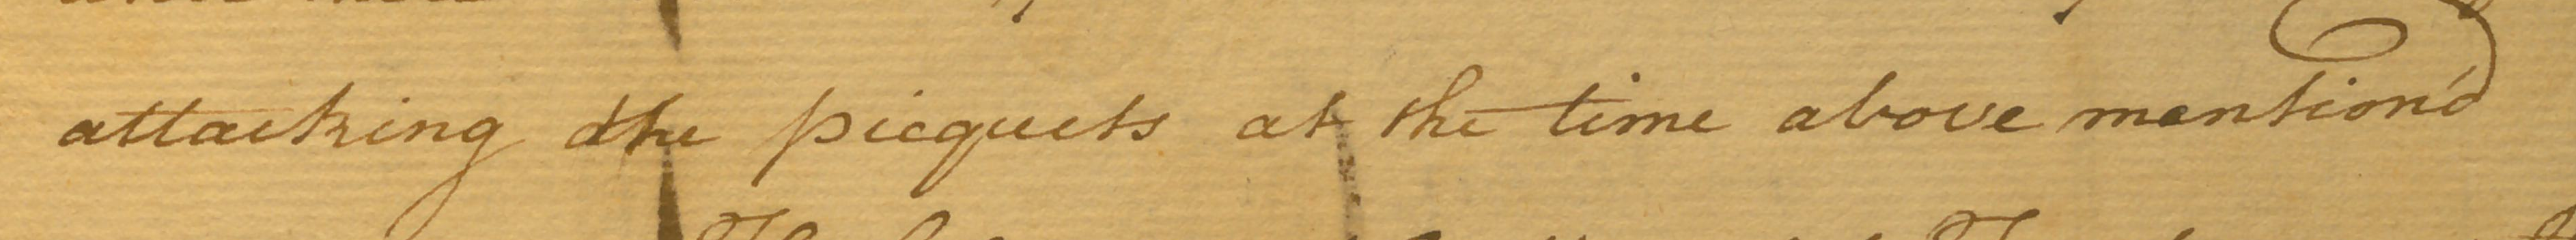attacking the picquets at the time above mention'd
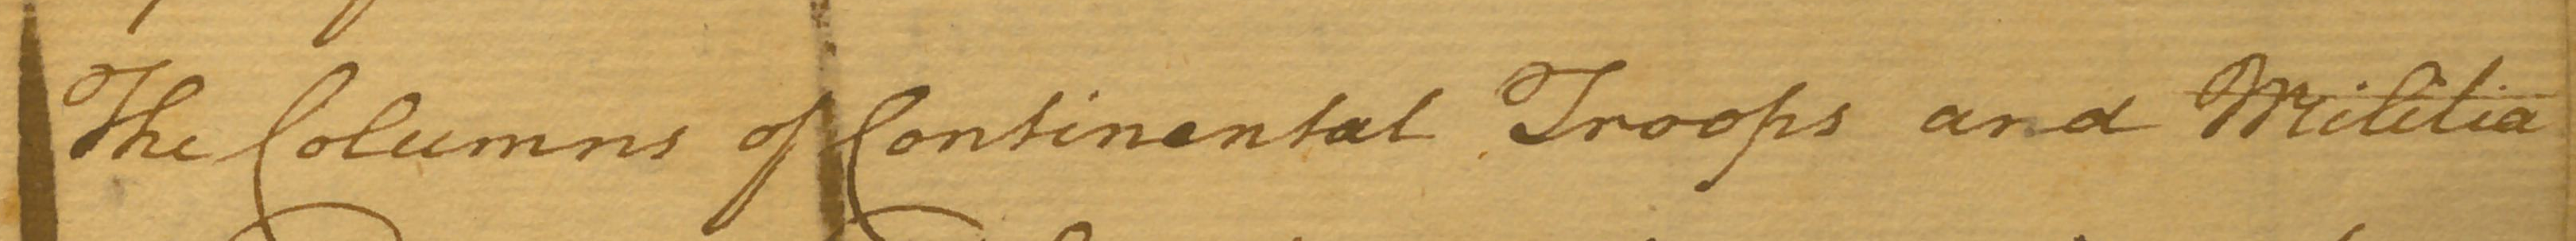The Columns of Continental Troops and Militia
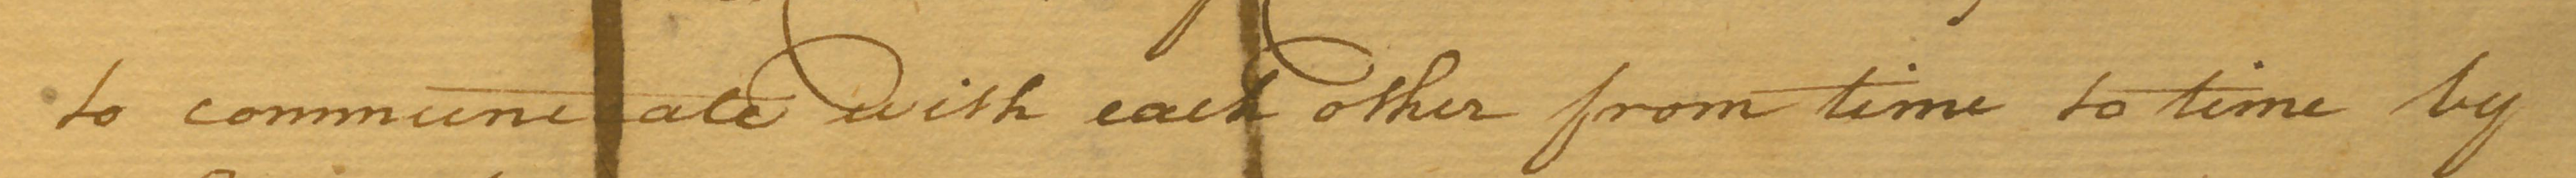to communicate with each other from time to time by
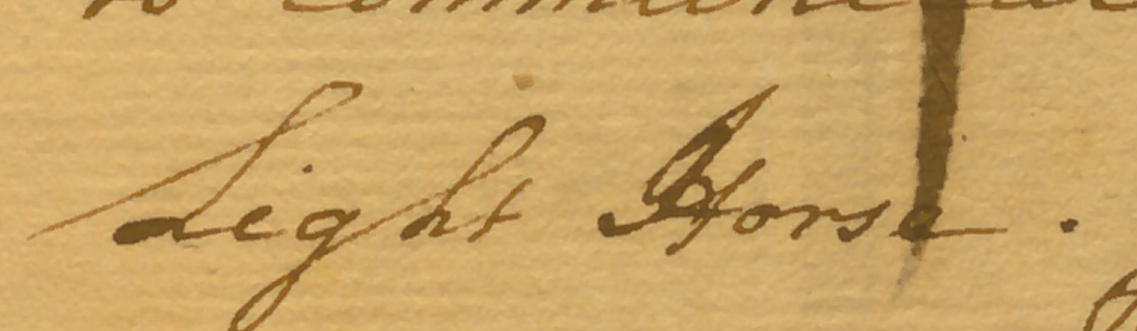Light Horse.
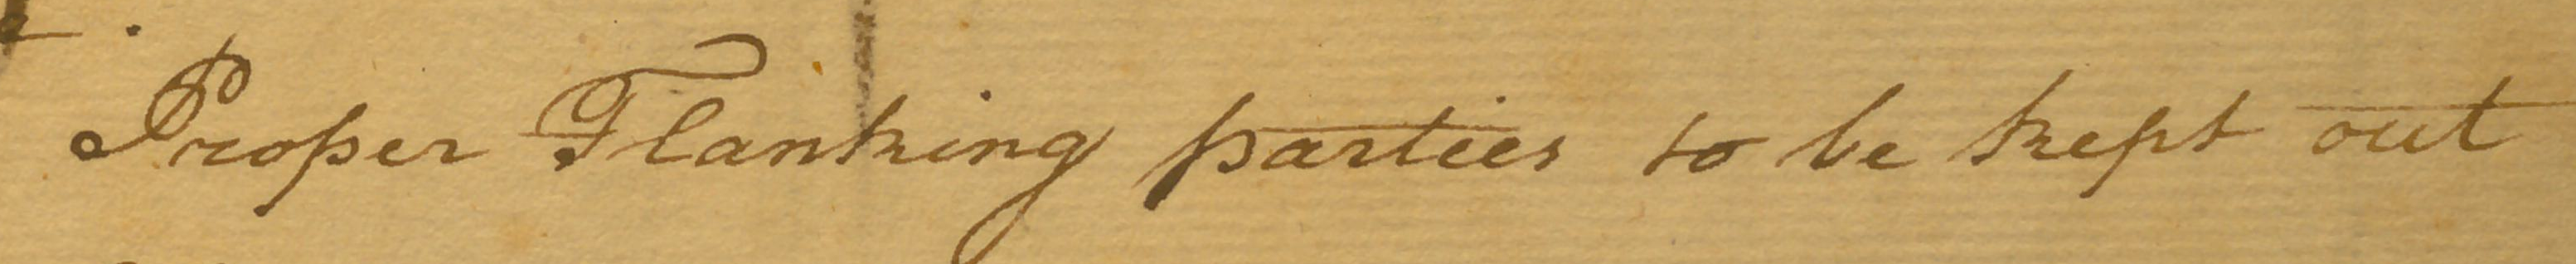Proper Flanking parties to be kept out
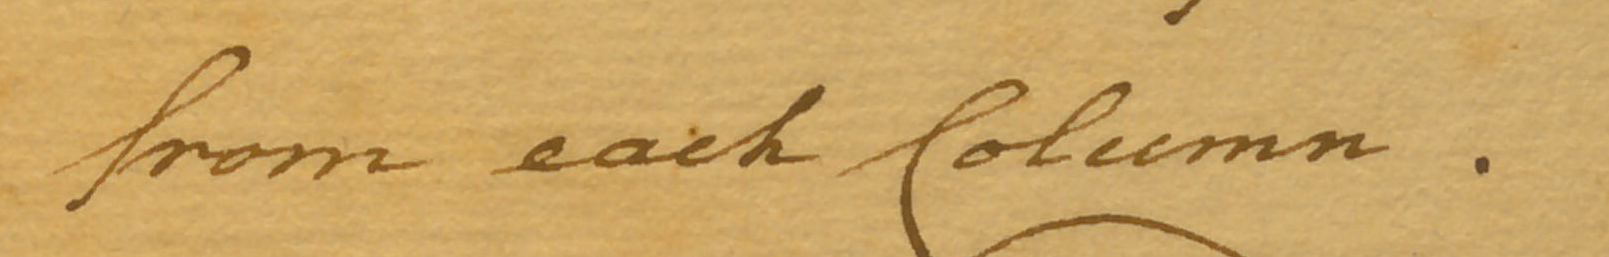from each Column.
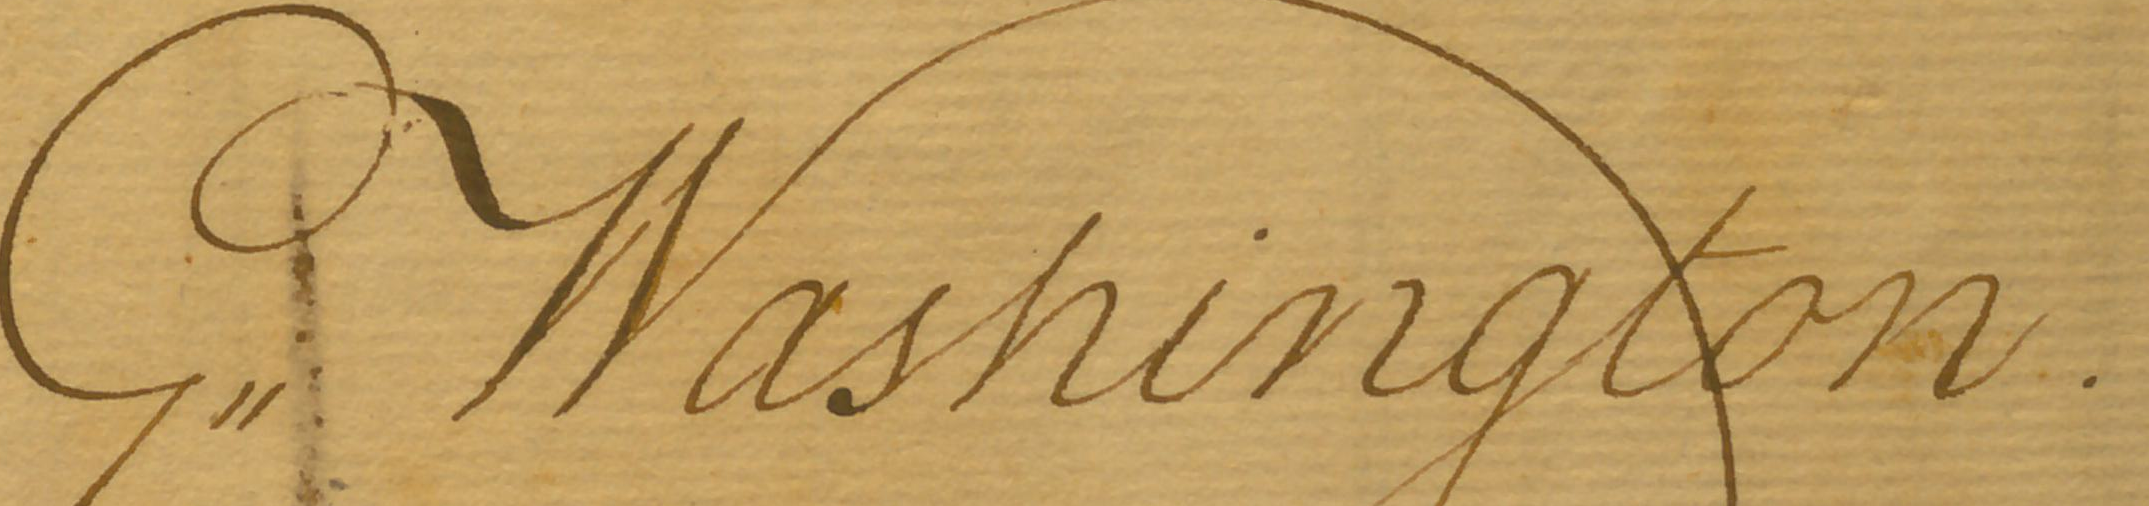G. Washington.
